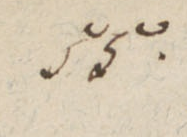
55.
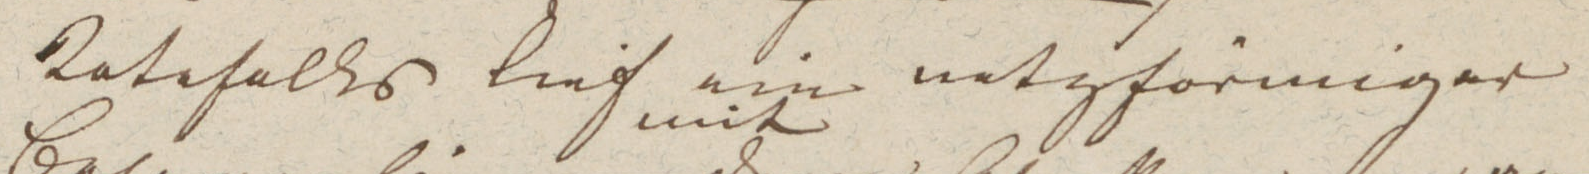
Katafalks lief ein netzförmiger
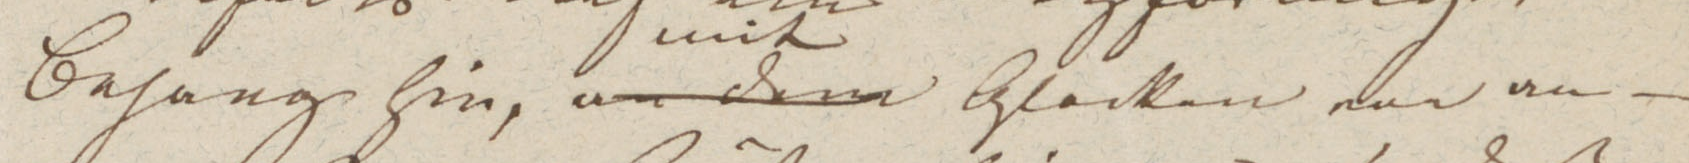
Behang hin, an dem mit Glocken von an-
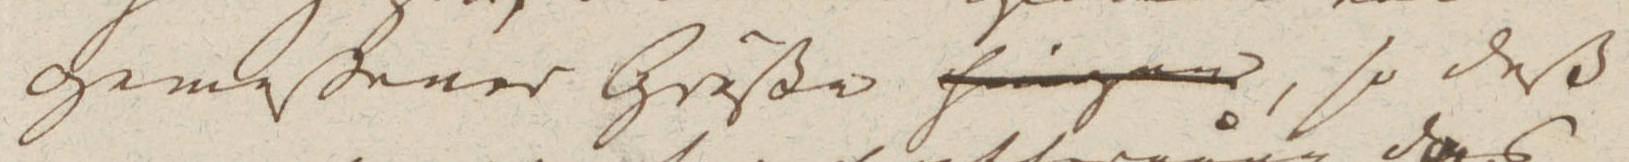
gemessener Grösse hingen, so dass
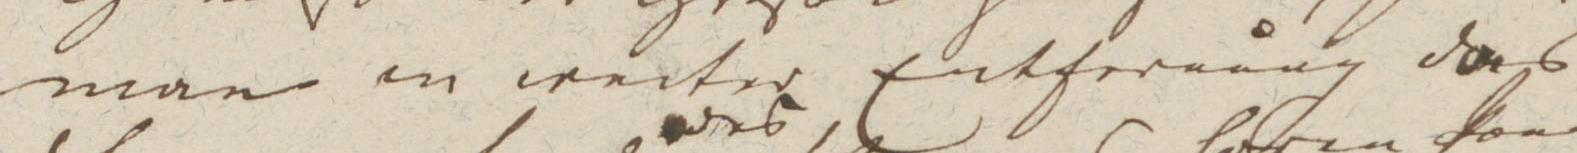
man in weiter Entfernung deas
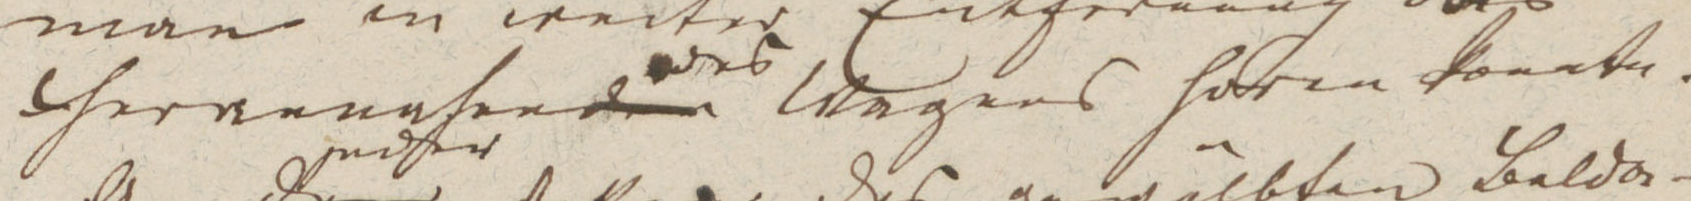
hHerannahenden des Wagens horen konnte.
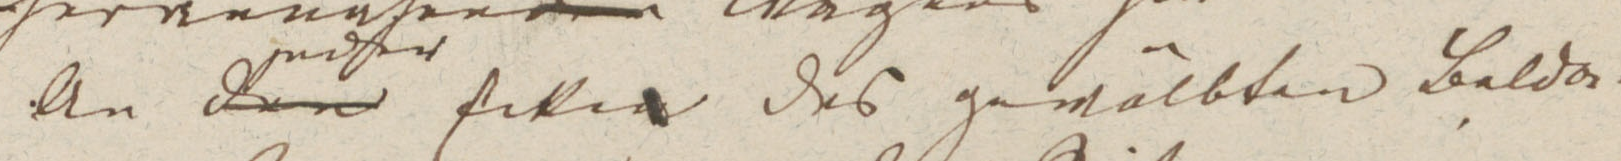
An den jeder Ecken des gewölbten Balda-
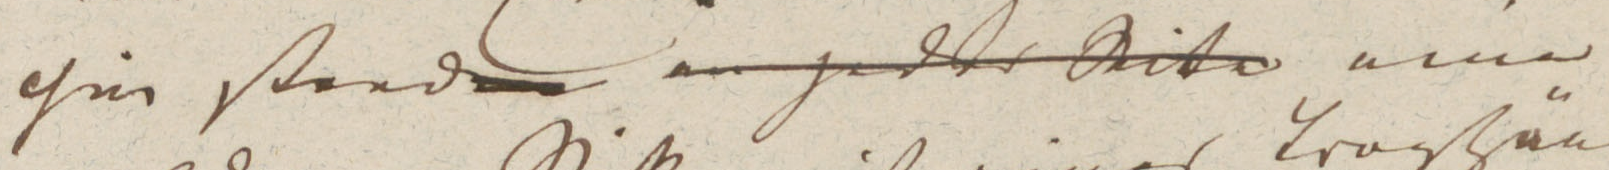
chin standen an jeder Seite eine
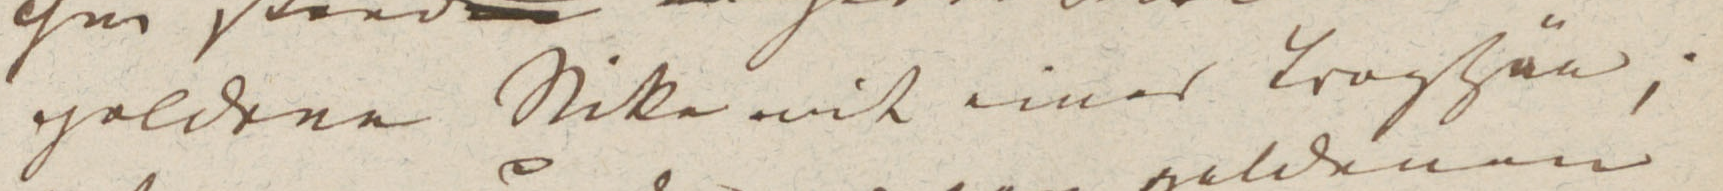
goldene Nike mit einer Trophäe;
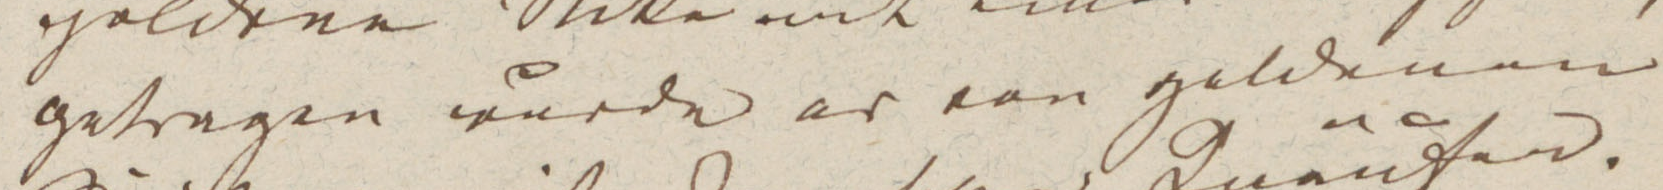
getragen wurde er von goldenen
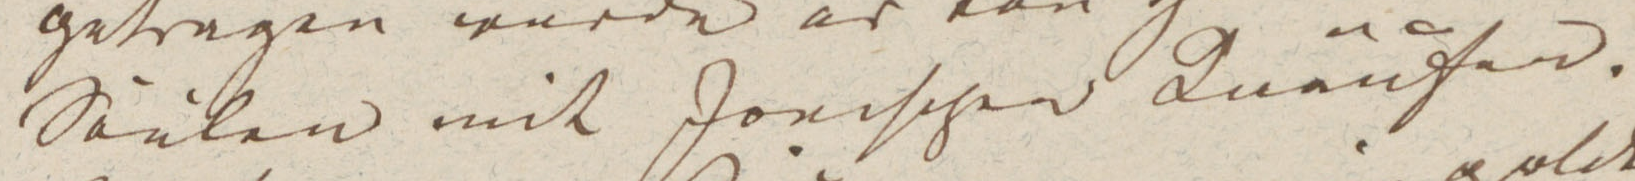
Säulen mit Ionischen Knäufen.
